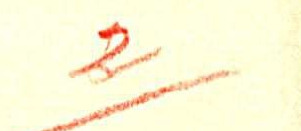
2
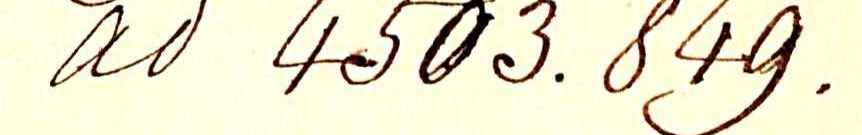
ad: 8983.
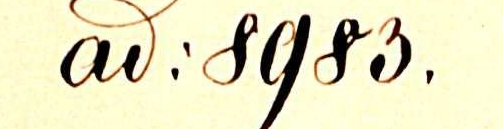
ad 4503.849.
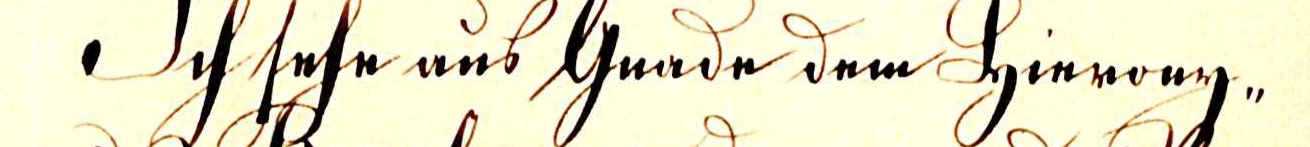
Ich sehe aus Gnade dem Hierony¬
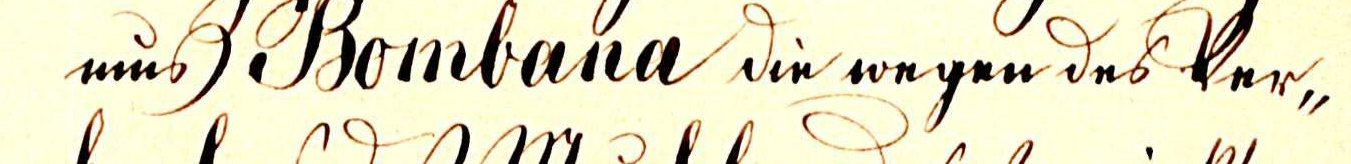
mus Bombana die wegen des Ver¬
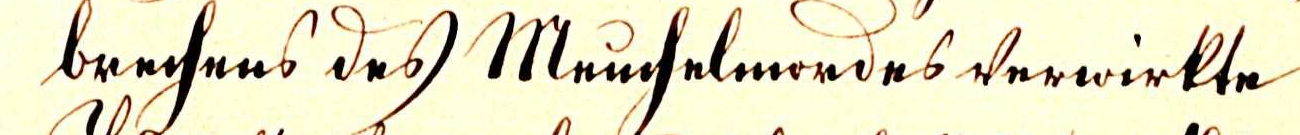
brechens des Meuchelmordes verwirkte
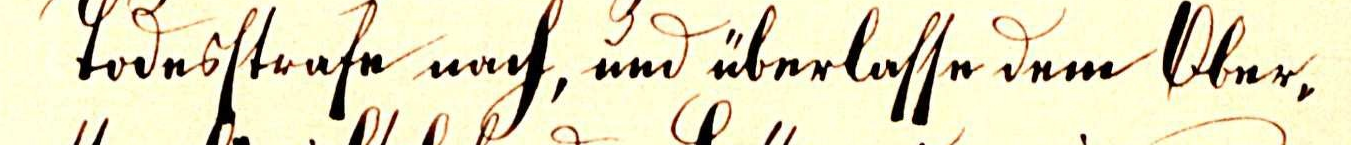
Todesstrafe nach, und überlasse dem Ober¬
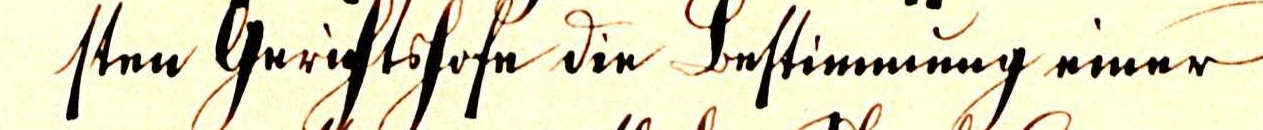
sten Gerichtshofe die Bestimmung einer
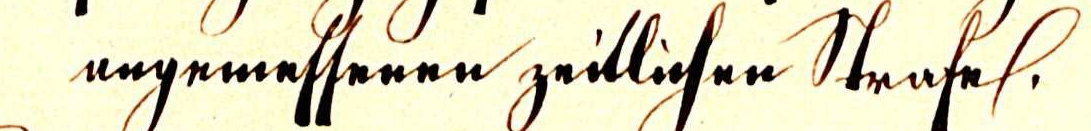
angemessenen zeitlichen Strafe.
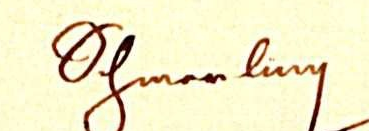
Schmerling
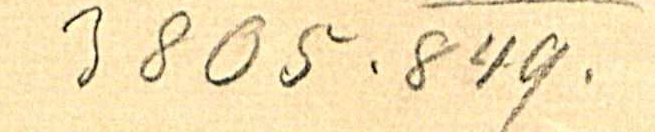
3805.849.
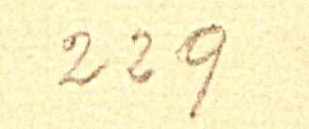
229
